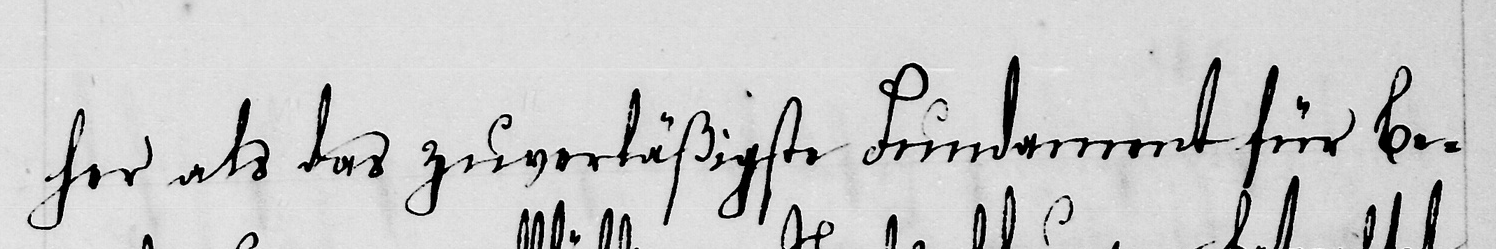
her als das zuverläßigste Fundament für Be¬
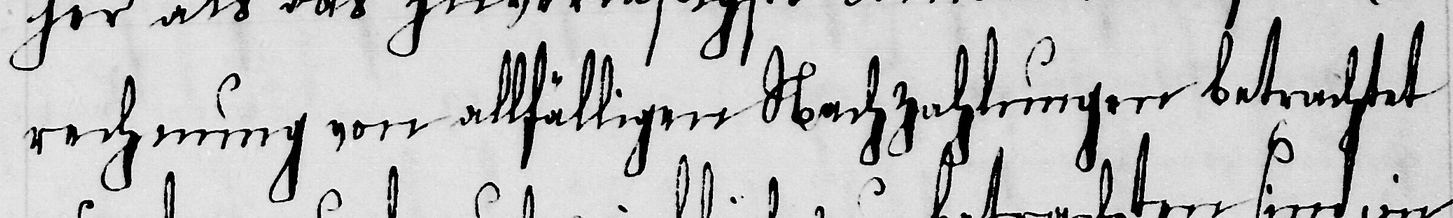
rechung von allfälligen Nachzahlungen betrachtet
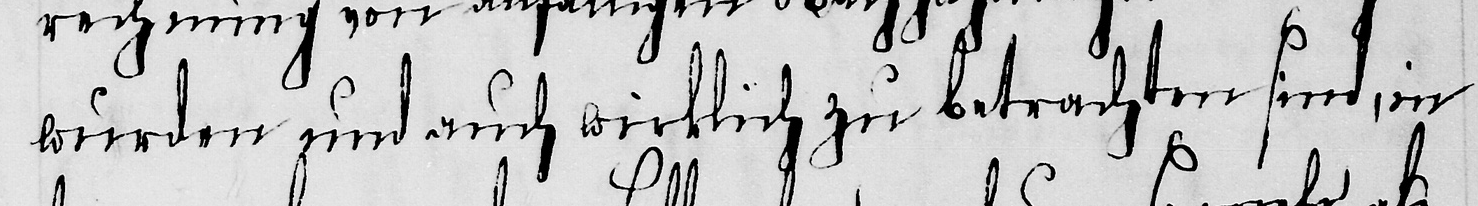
wurden und auch wirklich zu betrachten sind, in
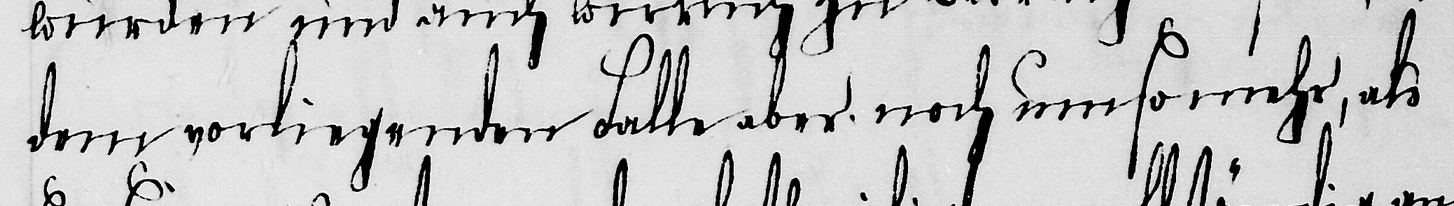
dem vorliegenden Falle aber noch umso mehr, als
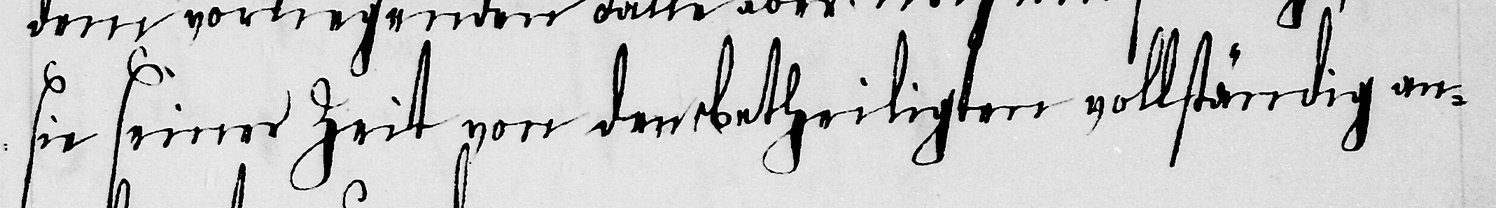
sie seiner Zeit von den betheiligten vollständig an¬
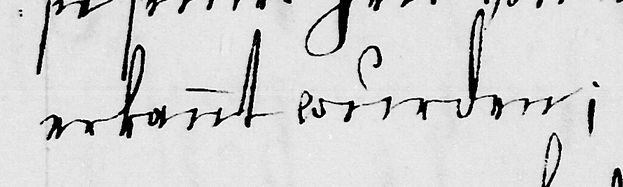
erkannt wurden;
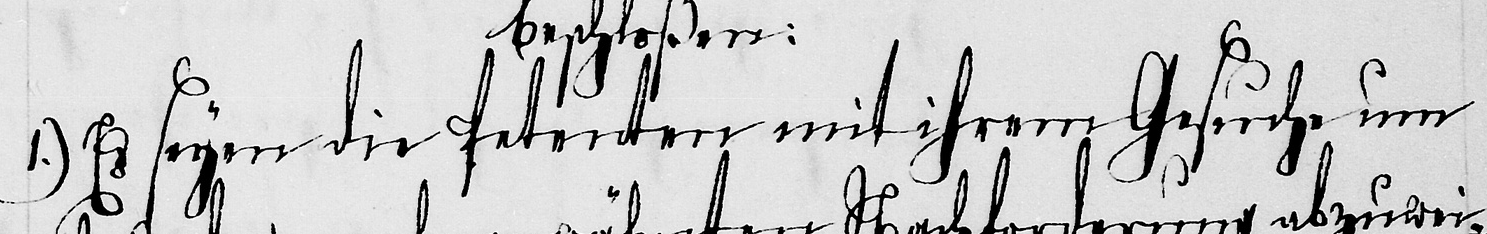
Es seyen die Petenten mit ihrem Gesuche um
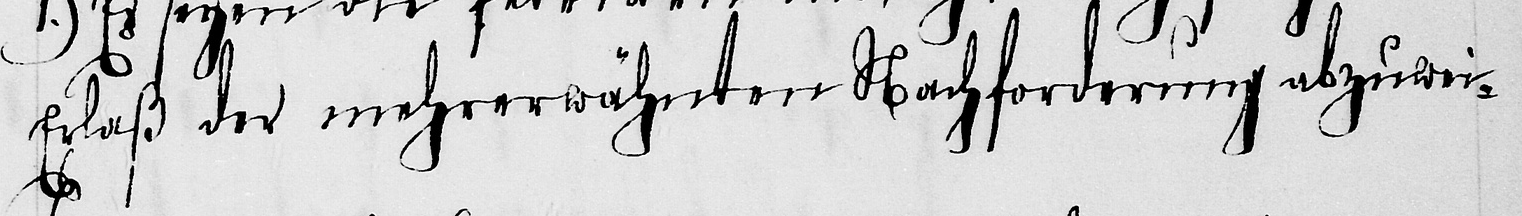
Erlaß der mehrerwähnten Nachforderung abzuwei¬
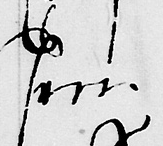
geneh¬
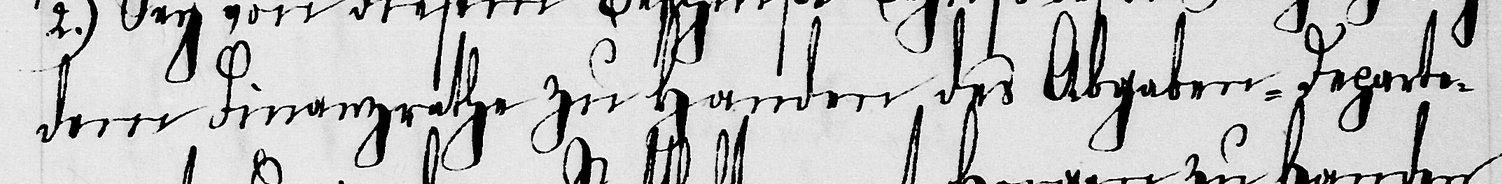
dem Finanzrathe zu Handen des Abgaben-Departe¬
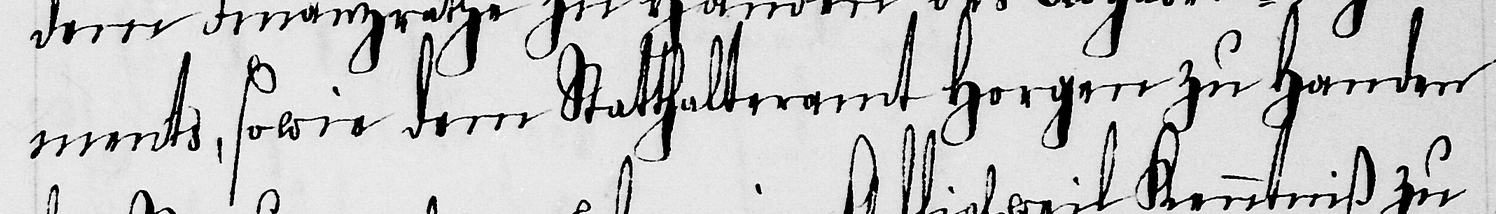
ments, sowie dem Statthalteramt Horgen zu Handen
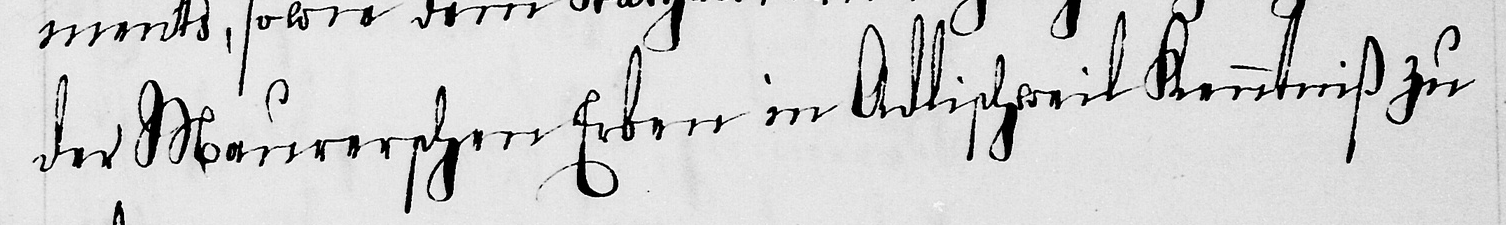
der Maurerschen Erben in Adlischweil Kenntniß zu
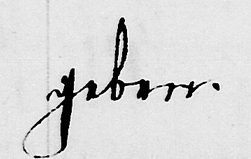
geben.
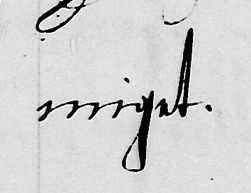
miget.
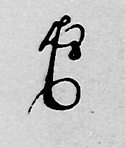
25.
